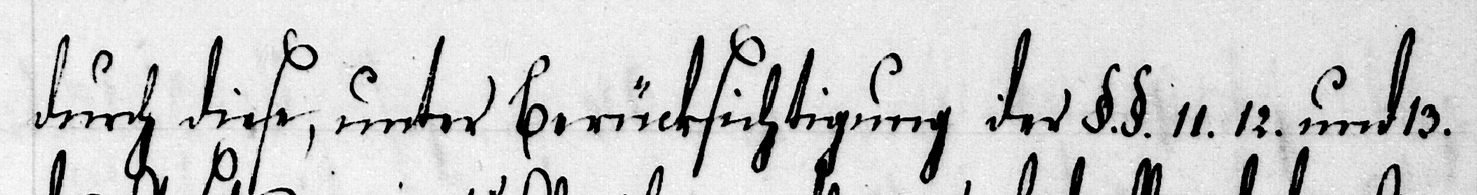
durch diese, unter Berücksichtigung der §.§. 11. 12. und
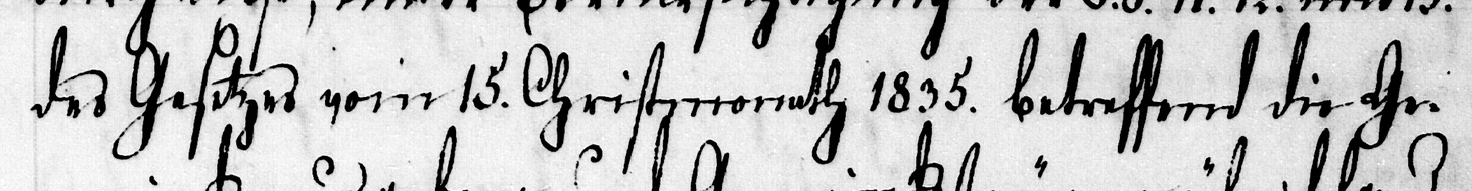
des Gesetzes vom 15. Christhmonath 1835. betreffend die Ge¬
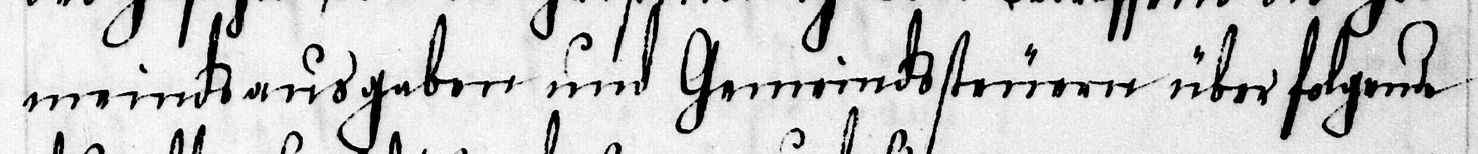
meinsausgaben und Gemeindssteuern über folgende
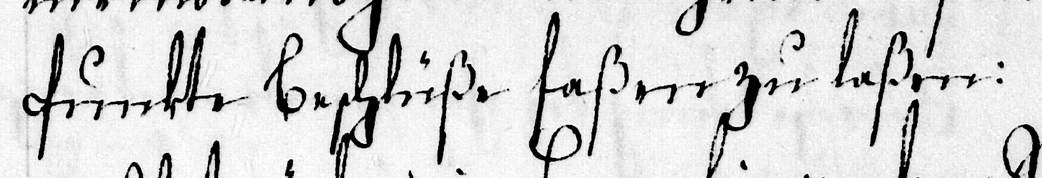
Punkte Beschlüße faßen zu laßen:
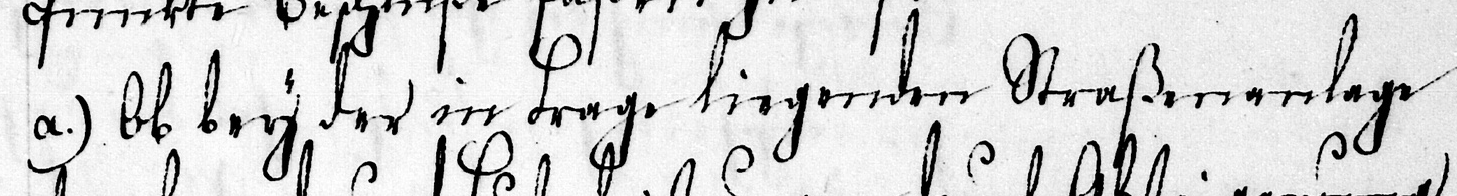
a.) Ob bey der in Frage liegenden Straßenanlage
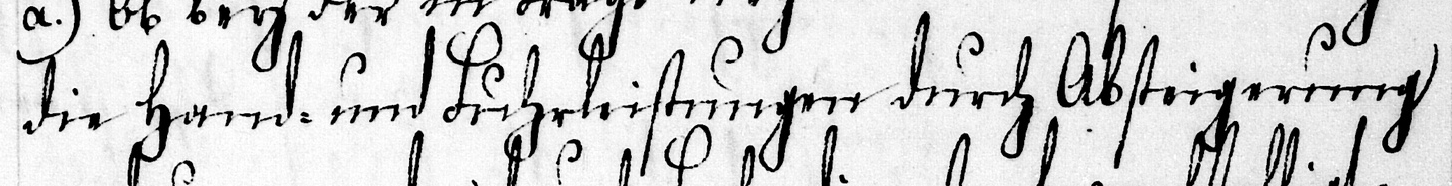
die Hand- und Fuhrleistungen durch Absteigerung
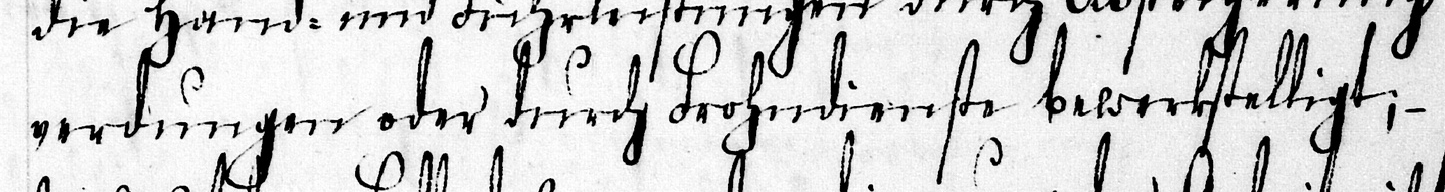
verdungen oder durch Frohndienste bewerkstelligt;
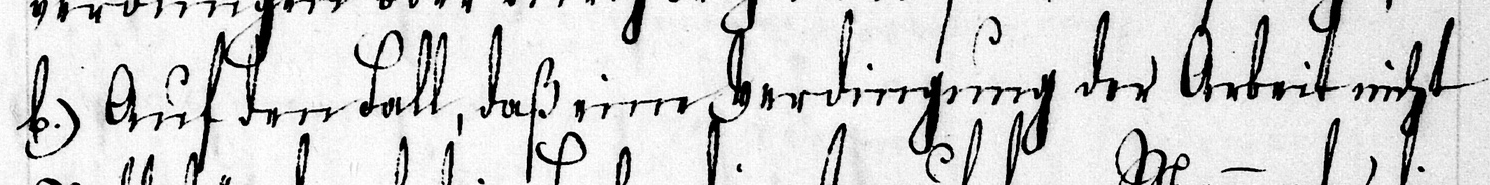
b.) Auf den Fall, daß eine Verdingung der Arbeit nicht
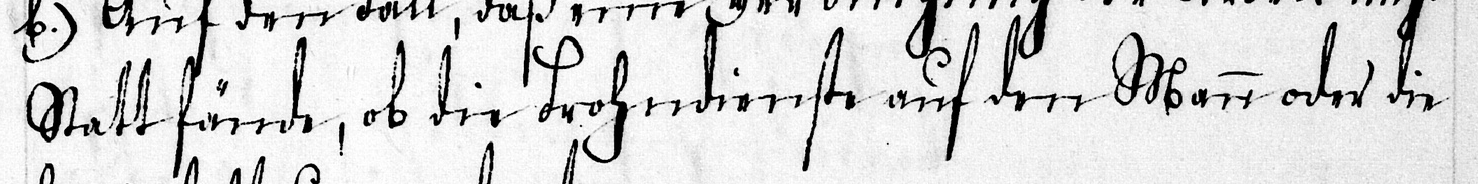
Statt fände, ob die Frohndienste auf den Mann oder die
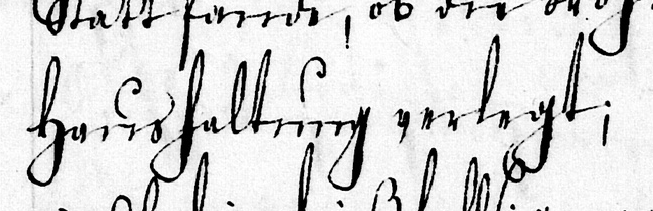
Haushaltung verlegt;
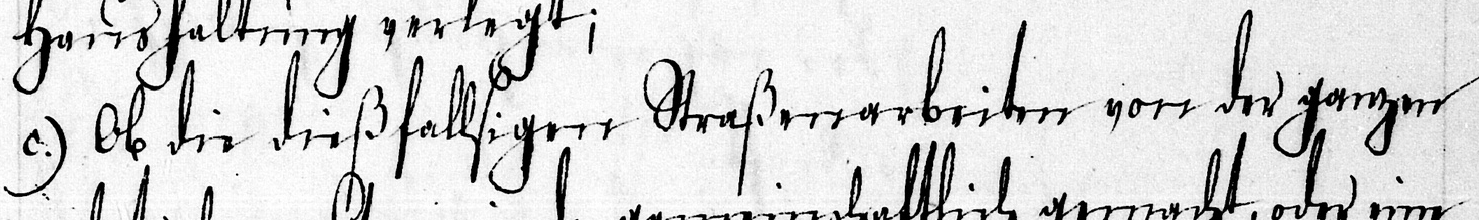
c.) Ob die dießfallsigen Straßenarbeiten von der ganzen
